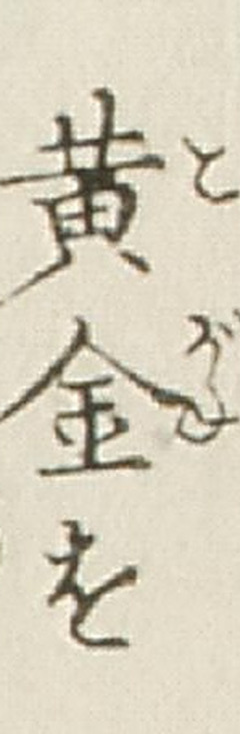黄金を
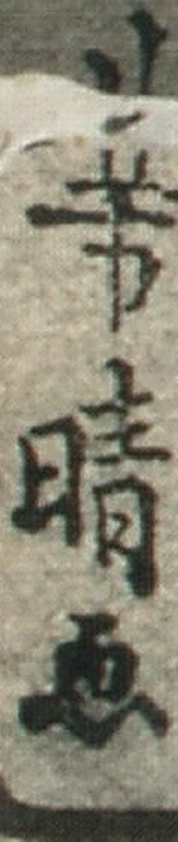芳晴画

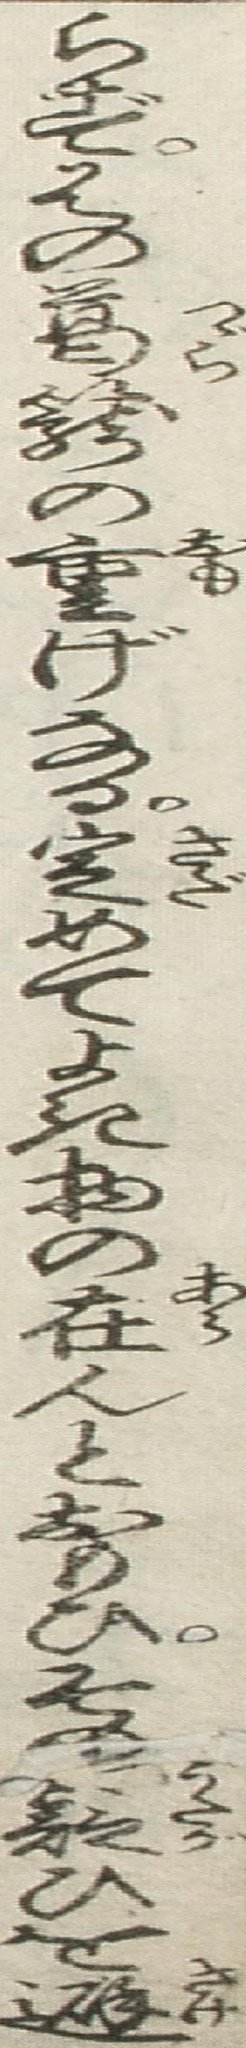らず。その葛籠の重げなる。定めてよき物の在んとおもひ。その疑ひを避
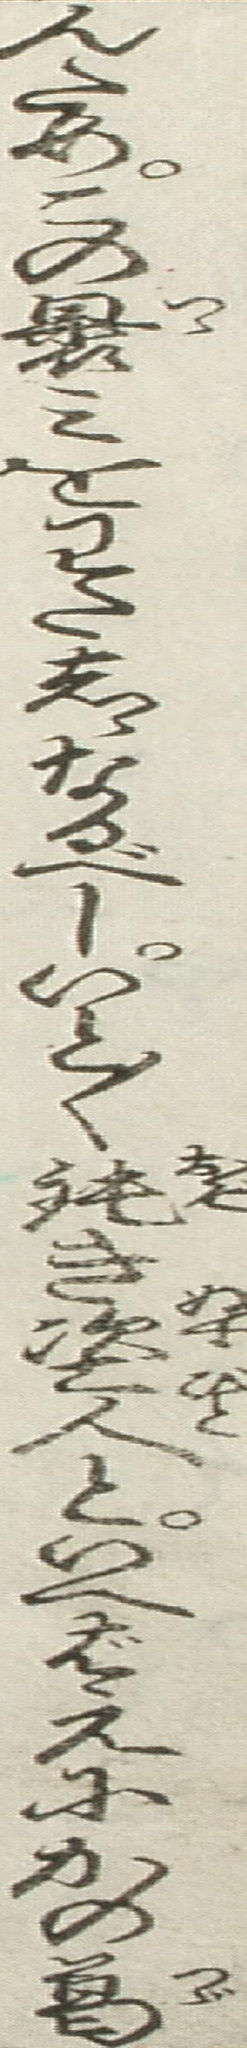んため。この褁みをわたしゝなるべし。いと〳〵鈍き盗人と。いへばえにかの葛
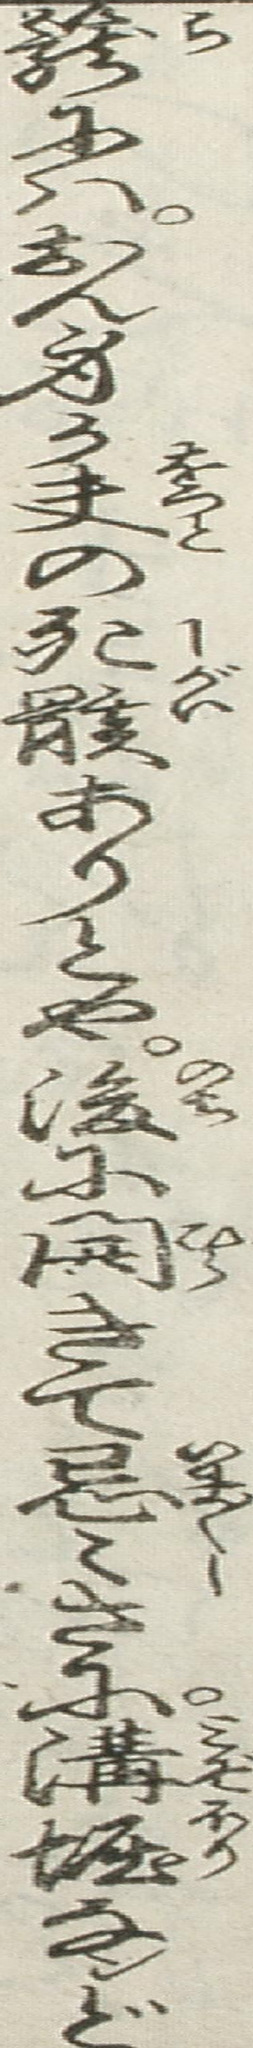籠には。おん身か夫の死骸ありとや。後に開きて忌〻さに。溝掘なンど
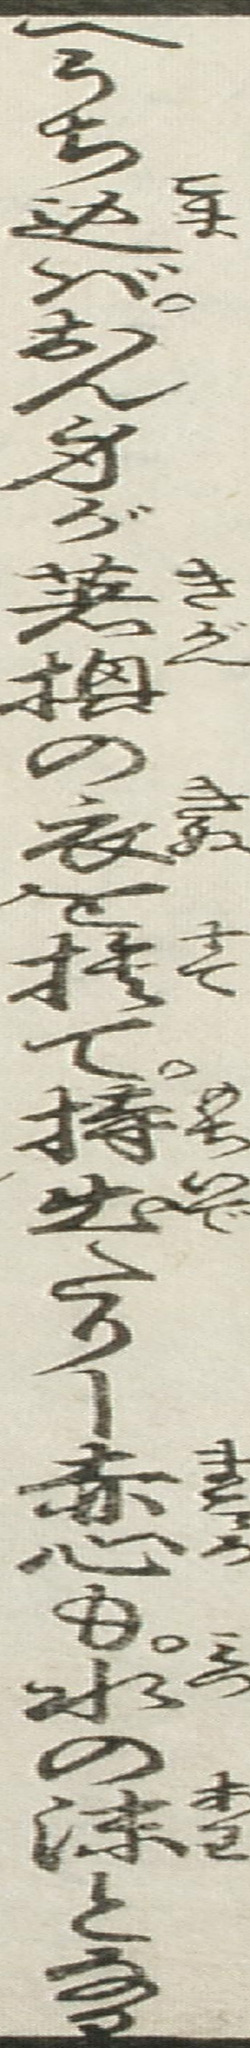へうち込ば。おん身が着換の衣を捨て。持出たりし赤心も。水の沫となる
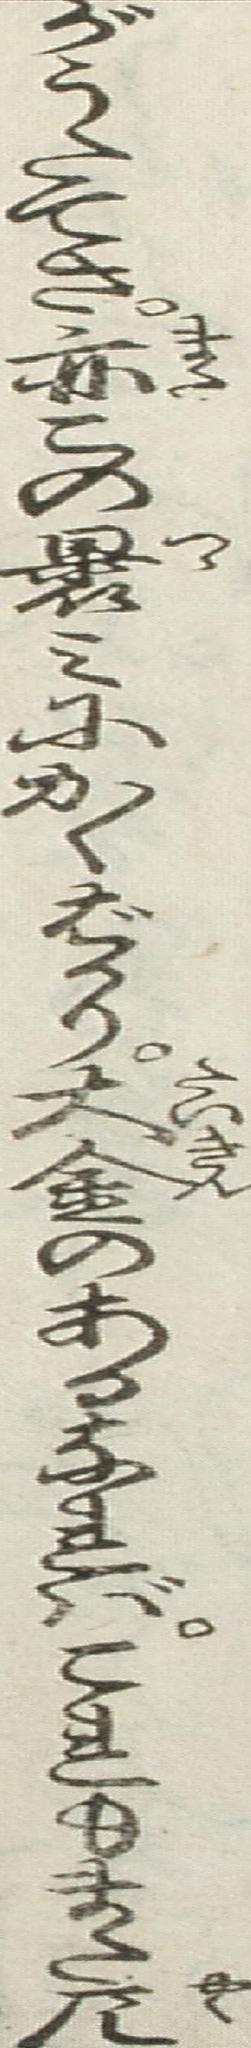がうたてさ。亦この褁みにかくばかり。大金のあるなれば。これもまた厄
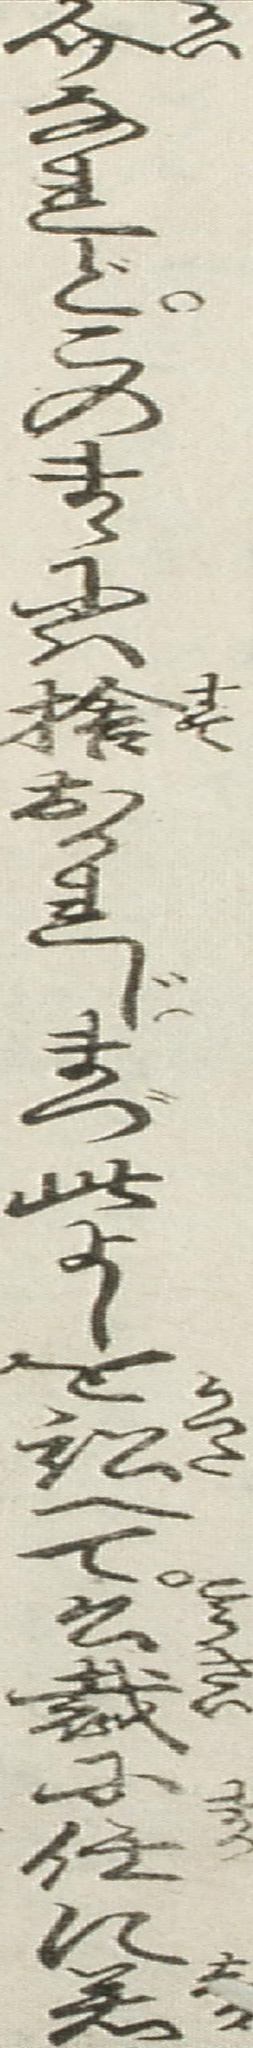介なれど。このまゝには捨おかれじまづ此よしを訟へて。公裁に任に若
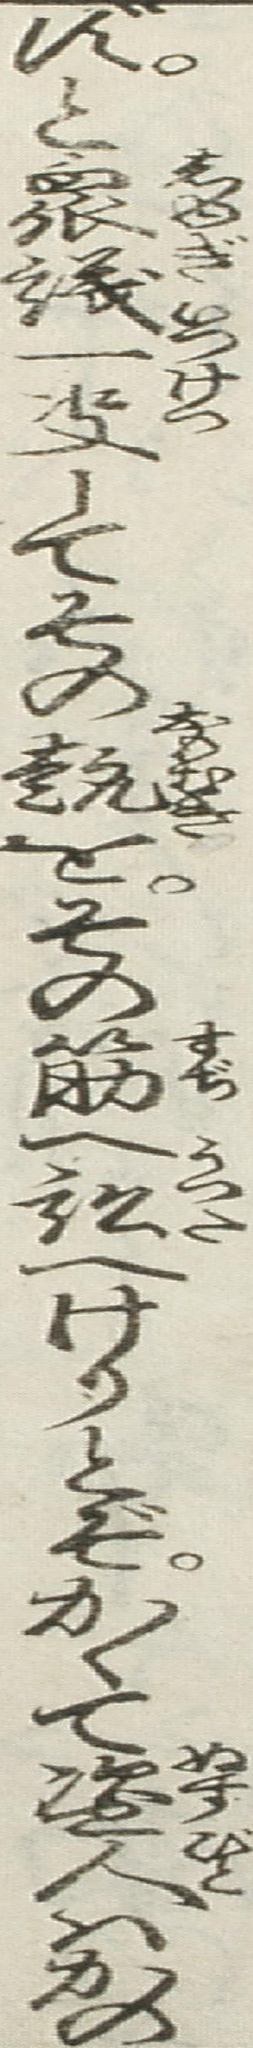ず。と衆議一決してその趣を。その筋へ訟へけりとぞ。かくて盗人はかの
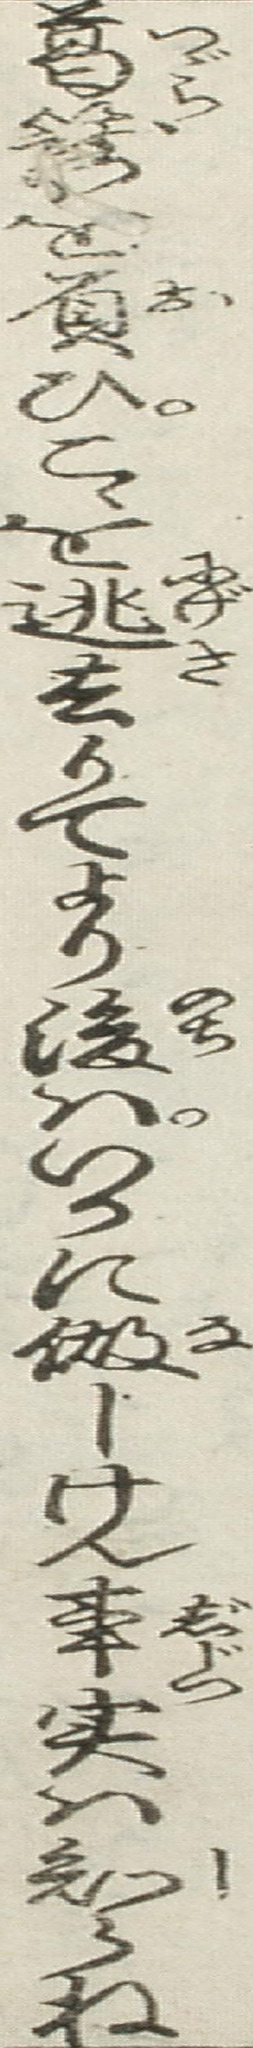葛籠を負ひ。こゝを逃去りてより後は。いかに倣しけん事実は知らね
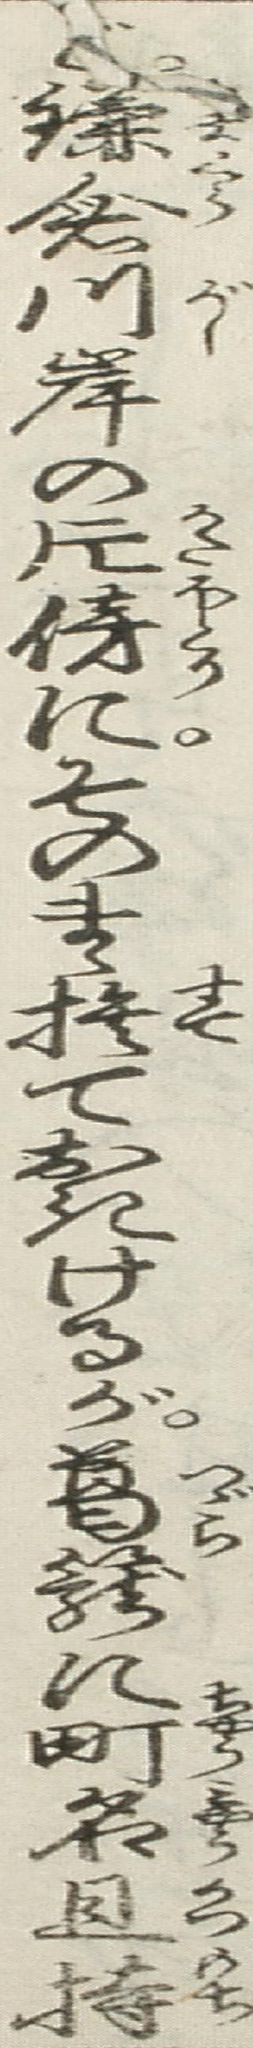ど鎌倉川岸の片傍に。そのまゝ捨ておきけるが。葛籠に町名且持
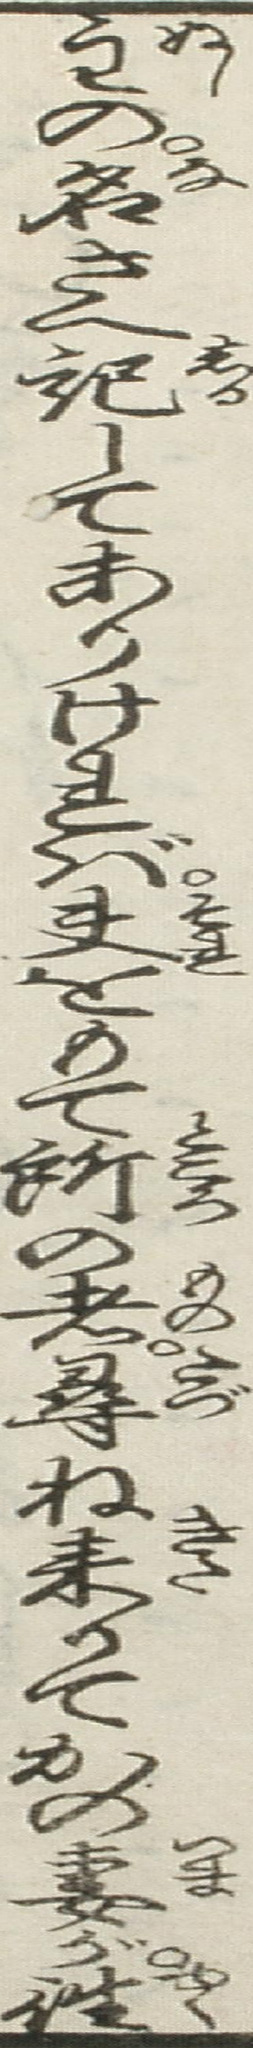主の。名さへ記してありければ。夫をもて所の者。尋ね来りてかの妻が。往
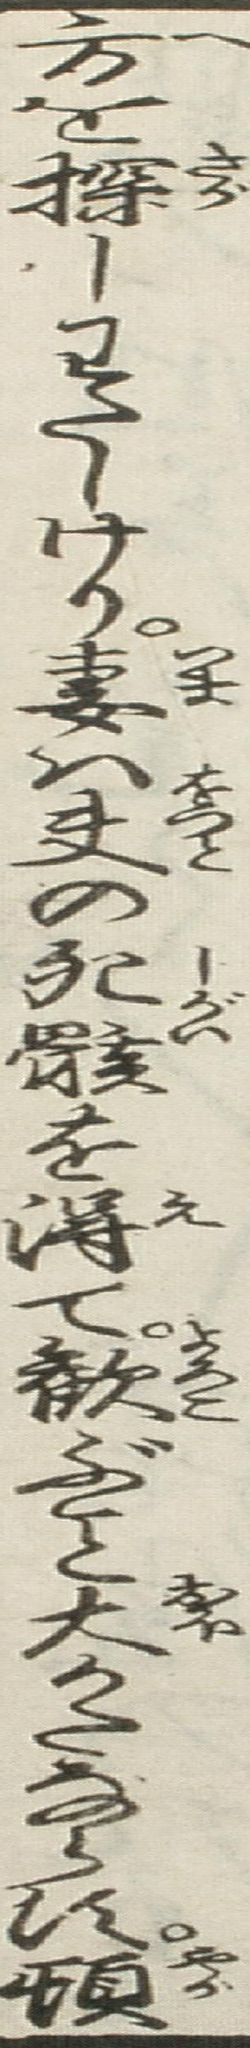方を探しわたしけり。妻は夫の死骸を得て歓ぶこと大かたならず。頓
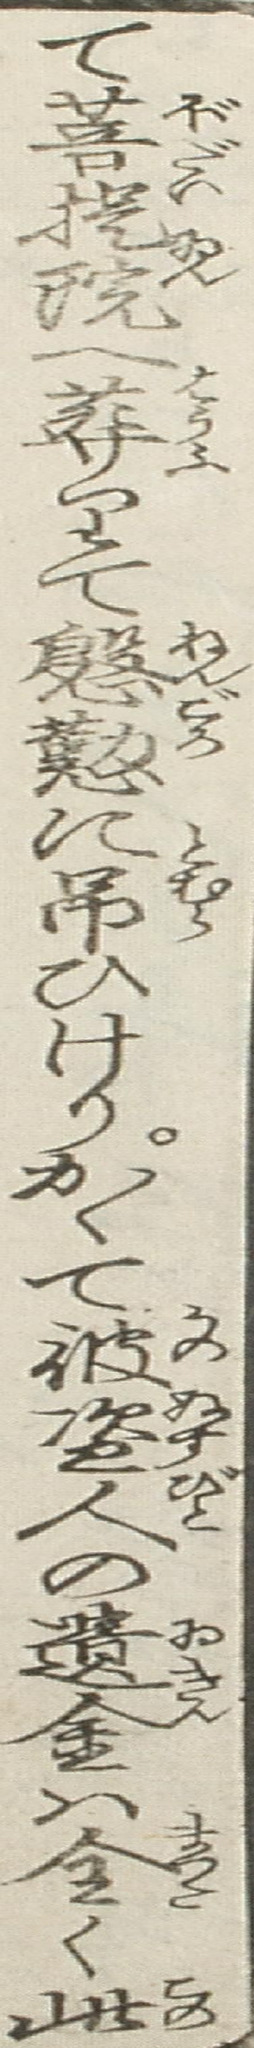て菩提院へ葬りて慇懃に弔ひけり。かくて彼盗人の遺金は全く此
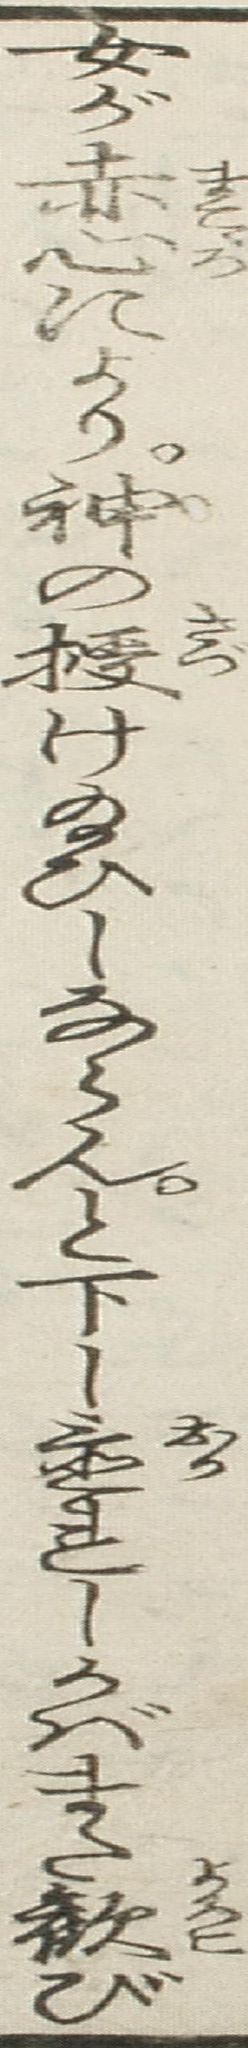女が赤心により。神の授け給ひしならん。と下し置れしかばまた歓び
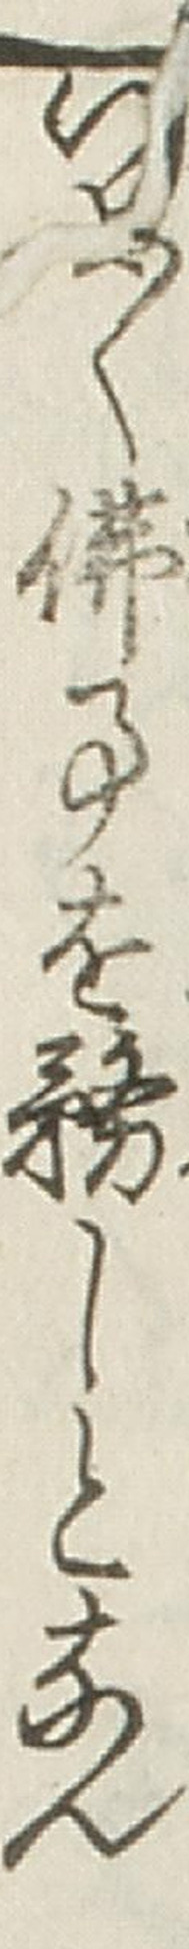いと〳〵仏事を務しとなん
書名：安政見聞録　下
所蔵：東京大学地震研究所図書室 Earthquake Research Institute Library, The University of Tokyo, JAPAN
